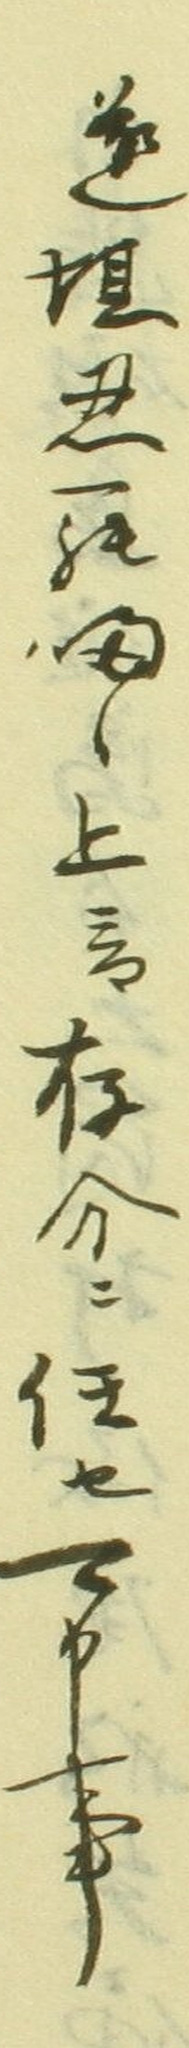遂堪忍罷帰候上ニ而存分に任せ可申事
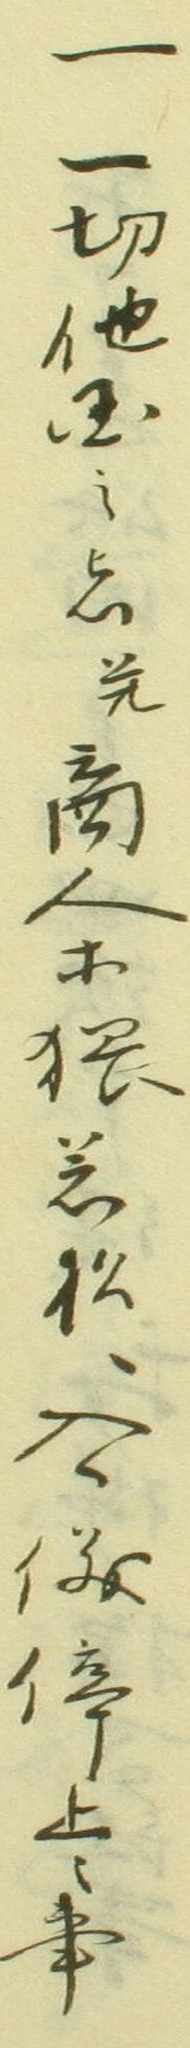一一切他国之者幷商人等猥若松へ入候儀停止之事
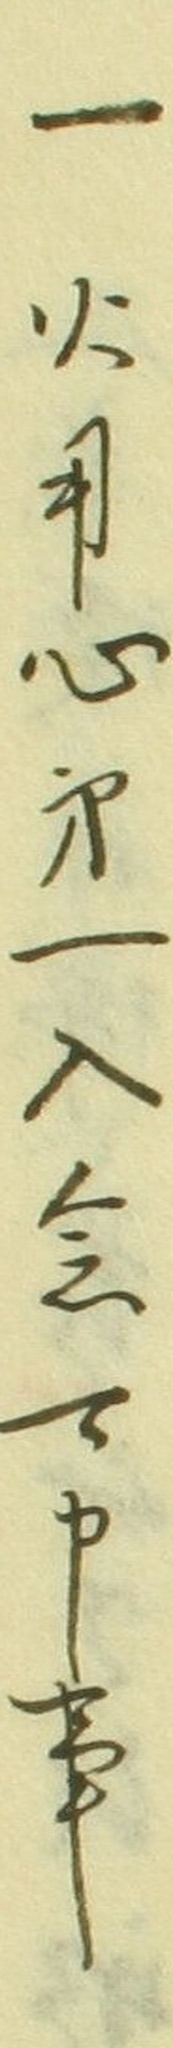一火用心第一入念可申事
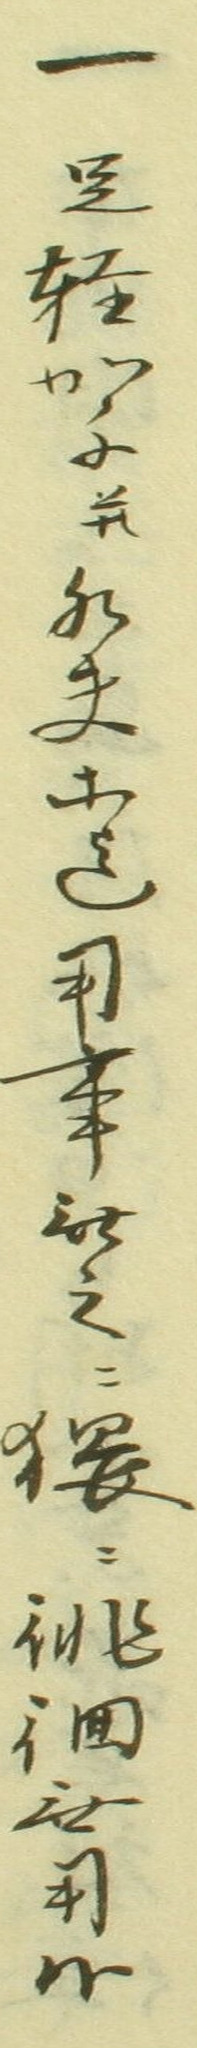一足軽加子幷水夫等迄用事無之ニ猥ニ徘徊無用候
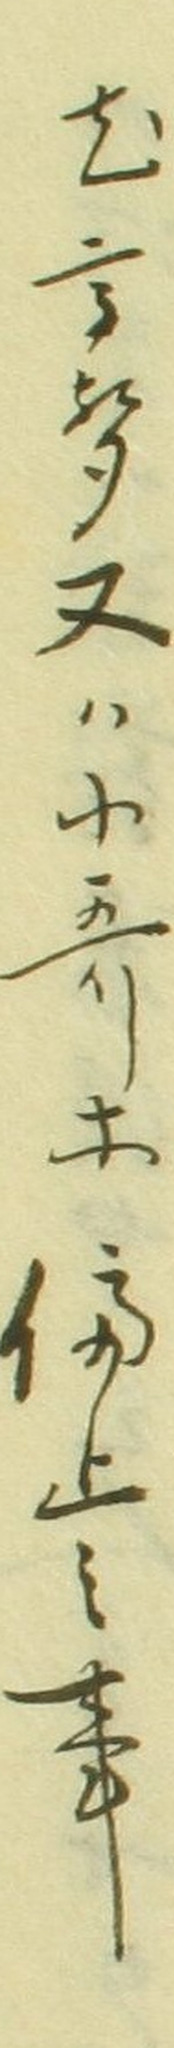尤高聲又は小哥等停止之事
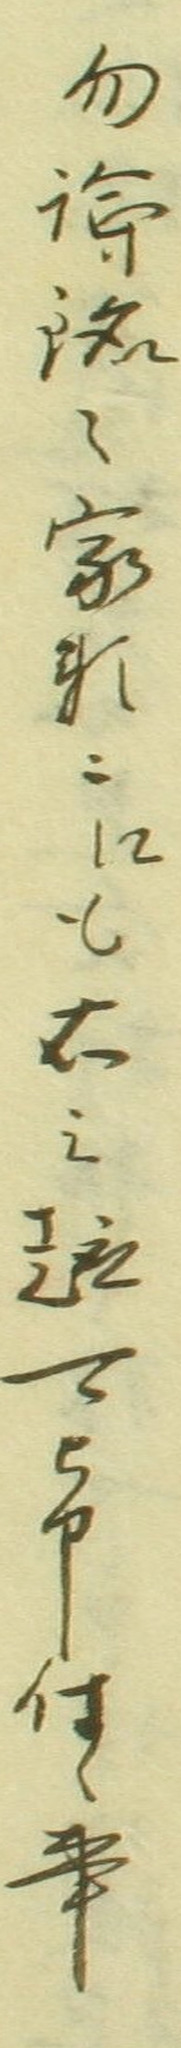勿論銘之家頼ニ江も右之趣可被申付候事
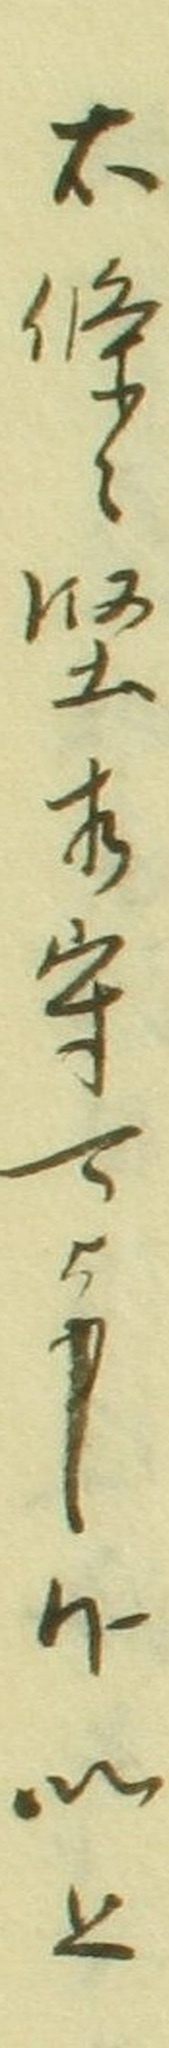右条々堅相守可被申候以上
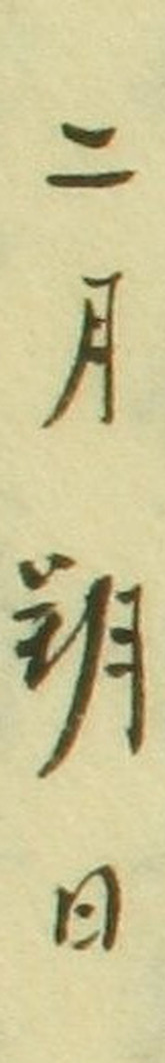二月朔日

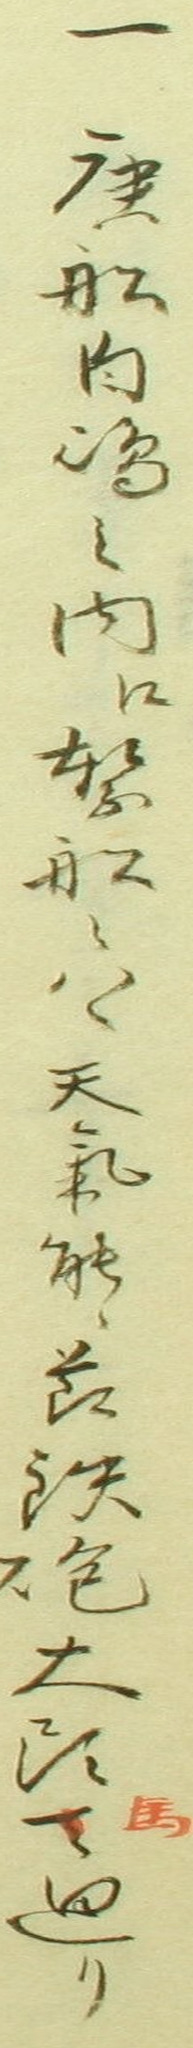一唐船白島之内江繋船候はゝ天気能候節鉄砲大頭馬廻り
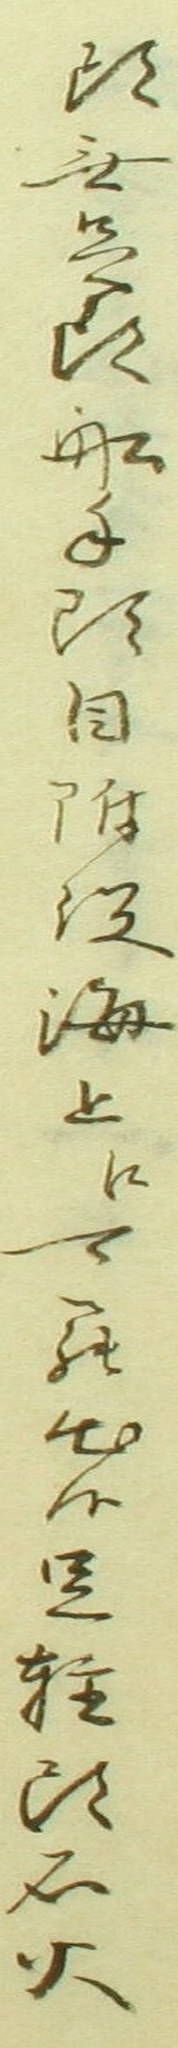頭無足頭船手頭目附役海上江可罷出候足軽頭石火
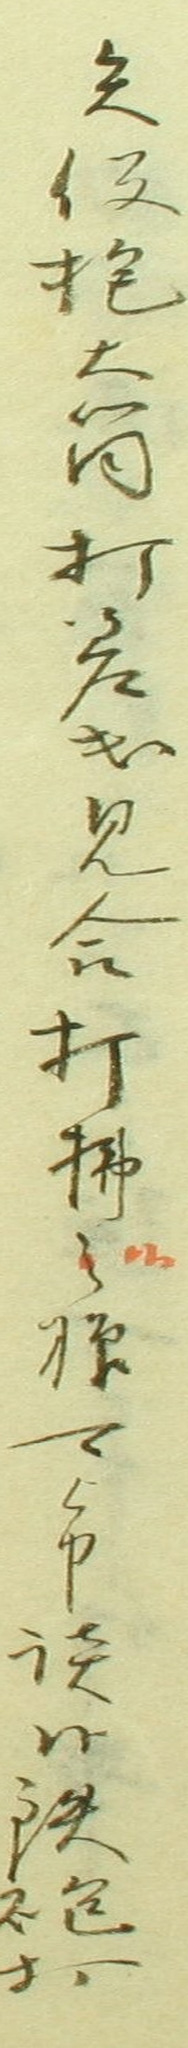矢役抱大筒打差出見合打払候様可被申談候鉄砲打
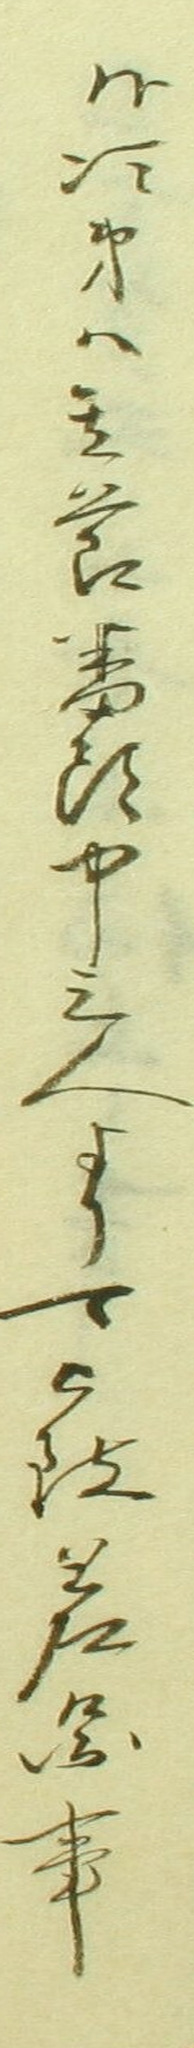候次第は其節番頭中三人より可被致差図事
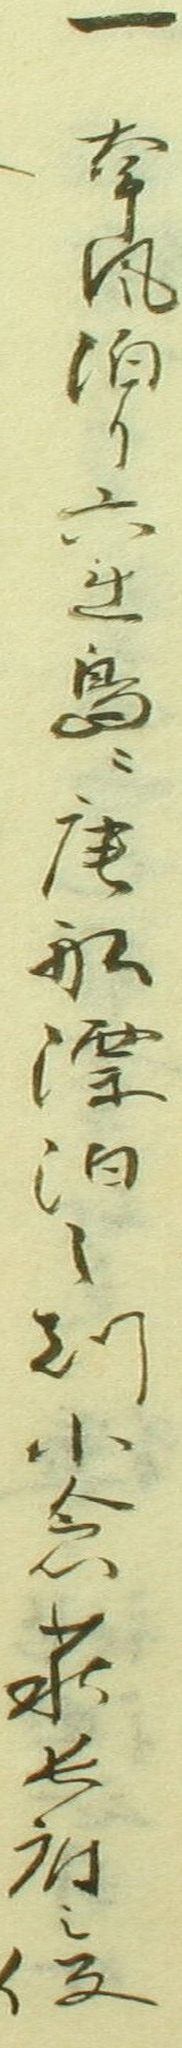一風泊り六連島ニ唐船漂泊之刻小倉荘長府之役
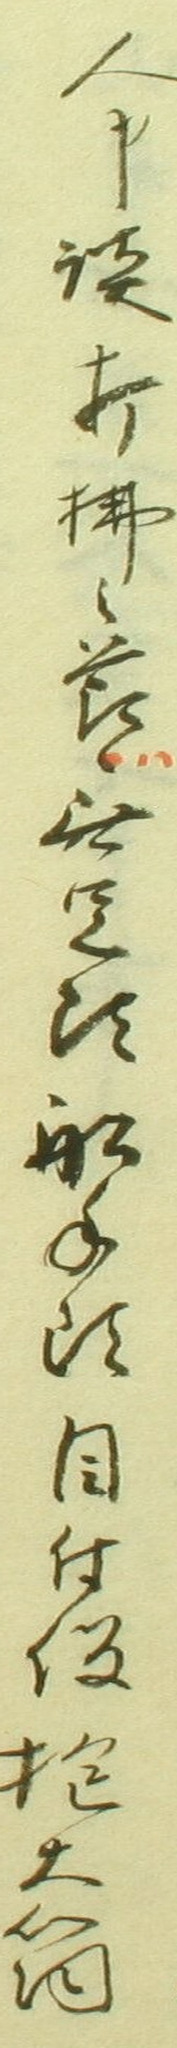人申談打払之節は無足頭船手頭目付役抱大筒
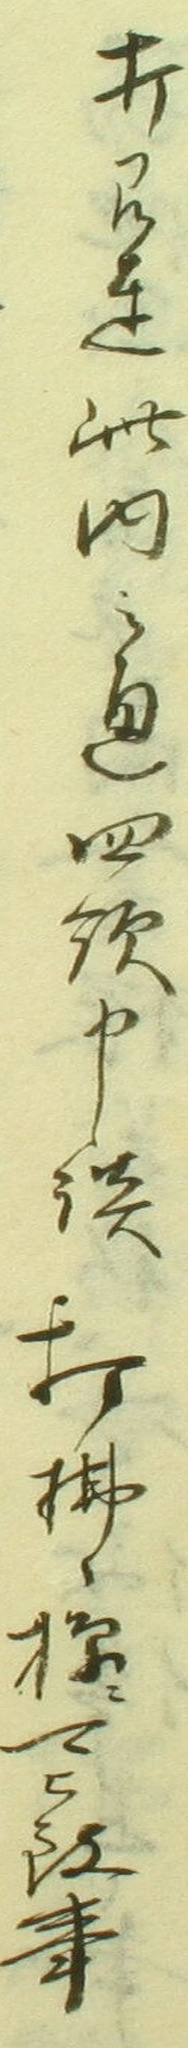打召連此内之通四領申談打払候様ニ可被致事
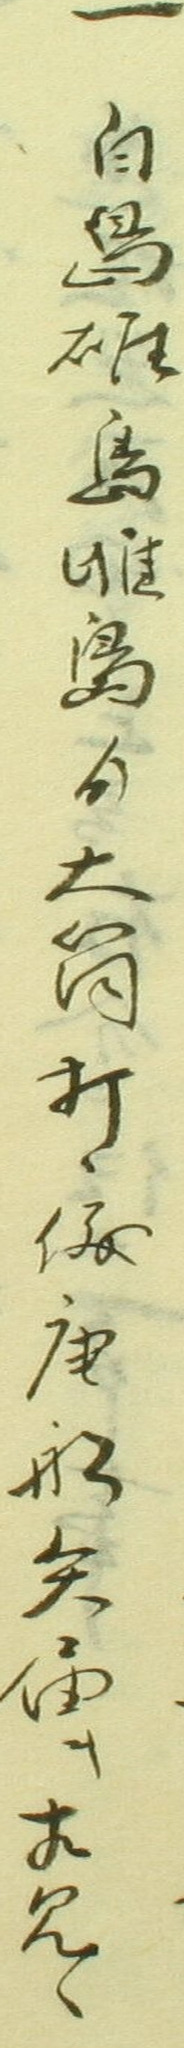一白島雄島雌島ゟ大筒打候儀唐船矢届も相見候
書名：唐船漂流記 二
